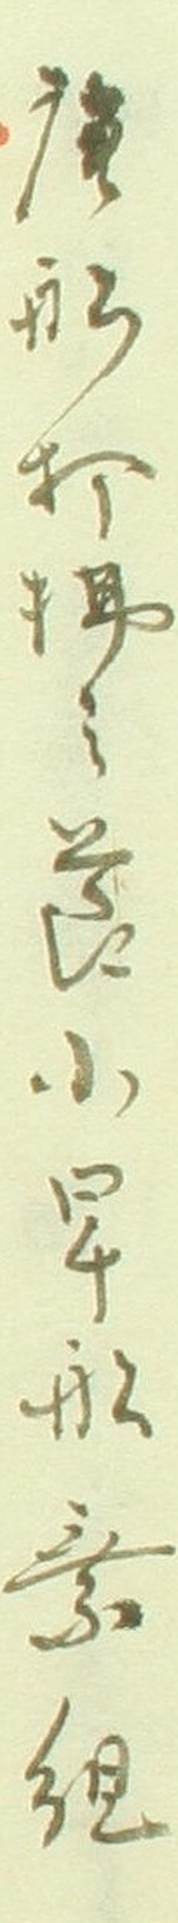唐船打払之節小早舟乗組
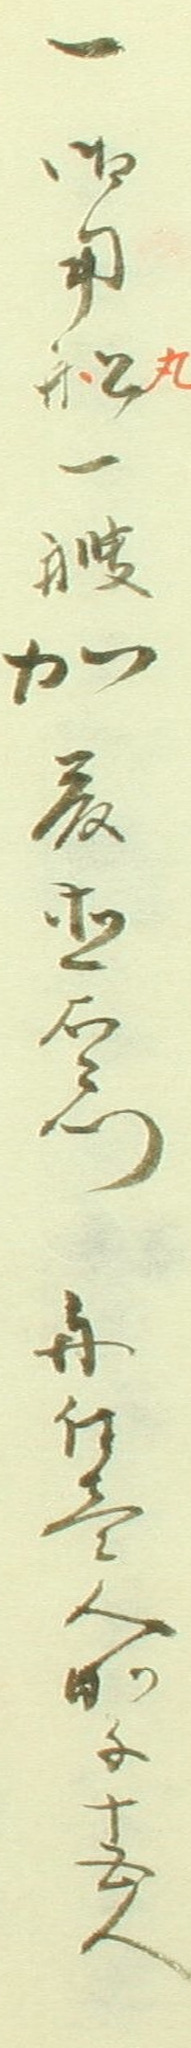一御用船一艘加藤直右衛門舟付壱人か子十五人
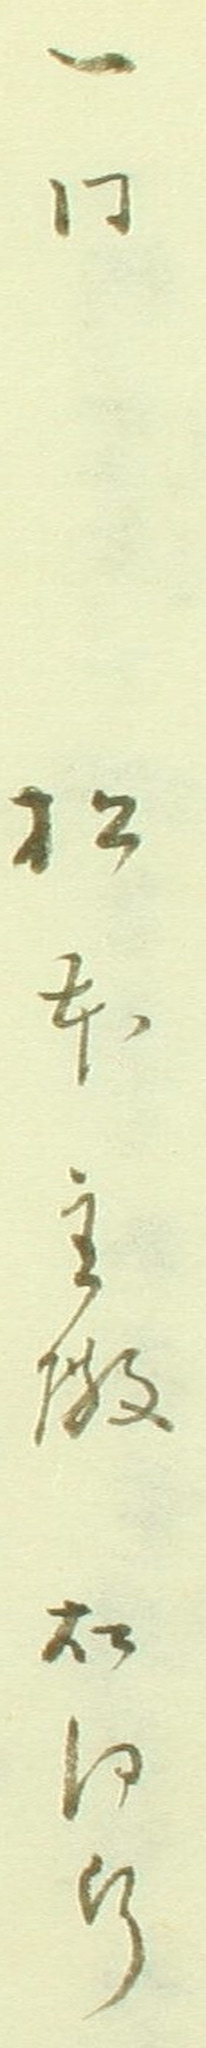一同松本主殿右同断
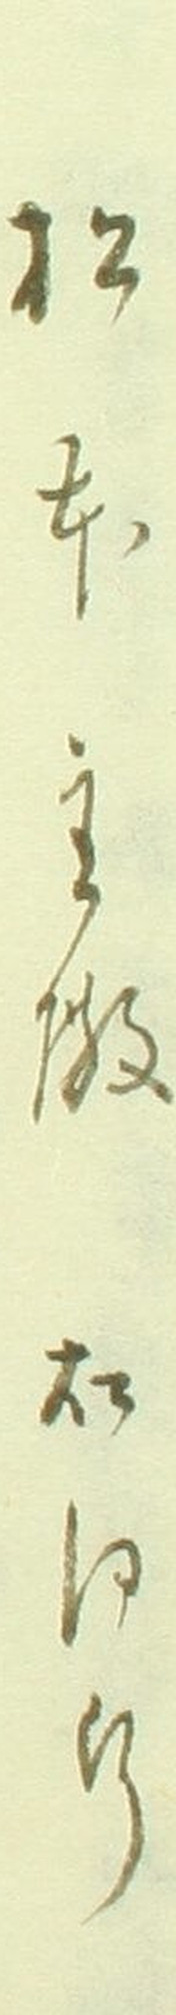一同松本主殿右同断
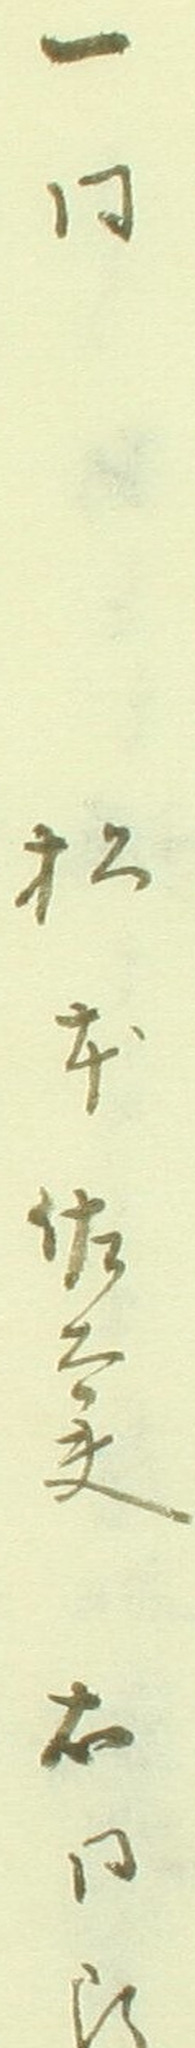一同松本佐太夫右同断
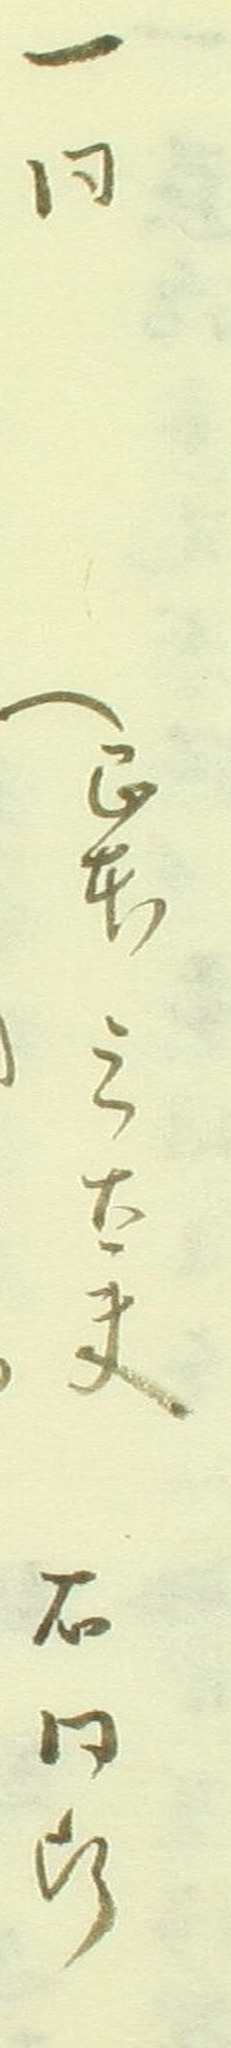一同正本三太夫右同断
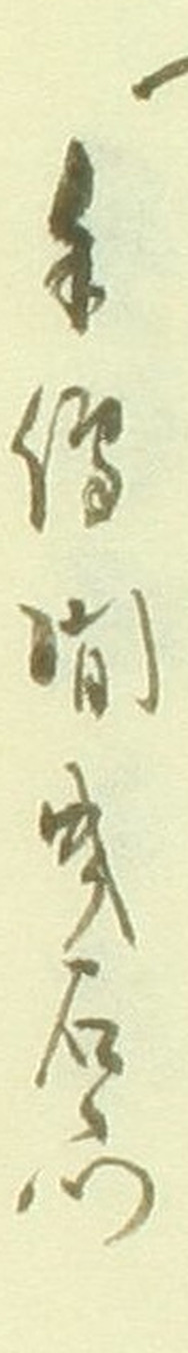手伝伝間幾右衛門
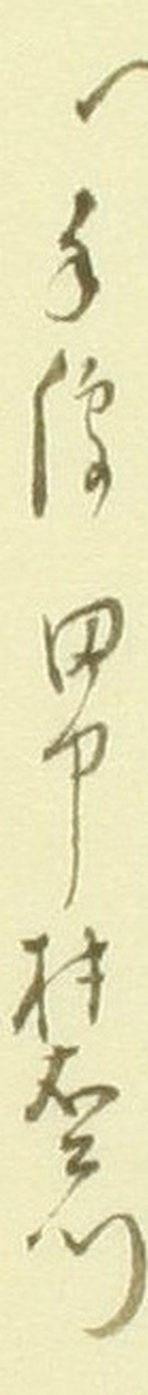手伝田中村右衛門
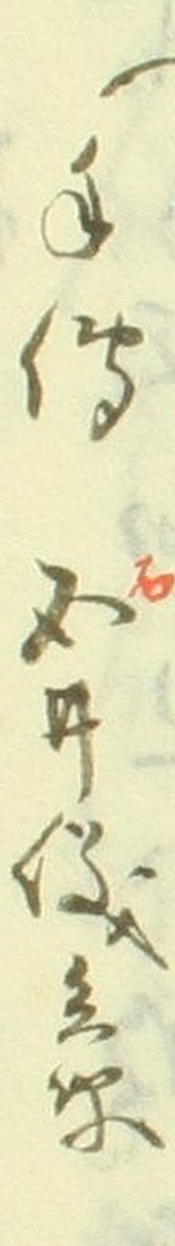手伝石井儀兵衛
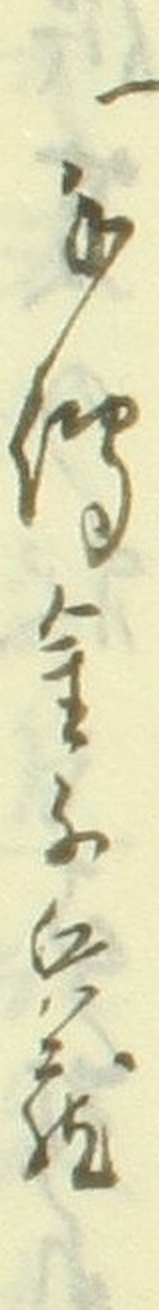手伝金子兵蔵
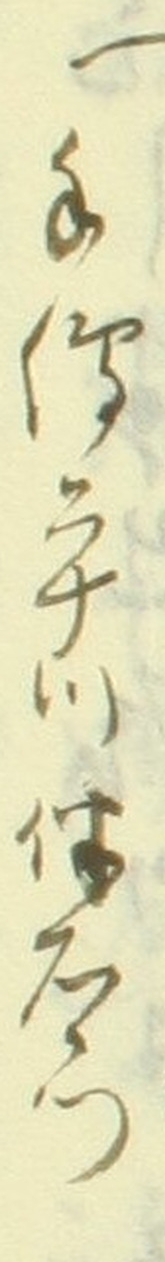手伝平川伴右衛門
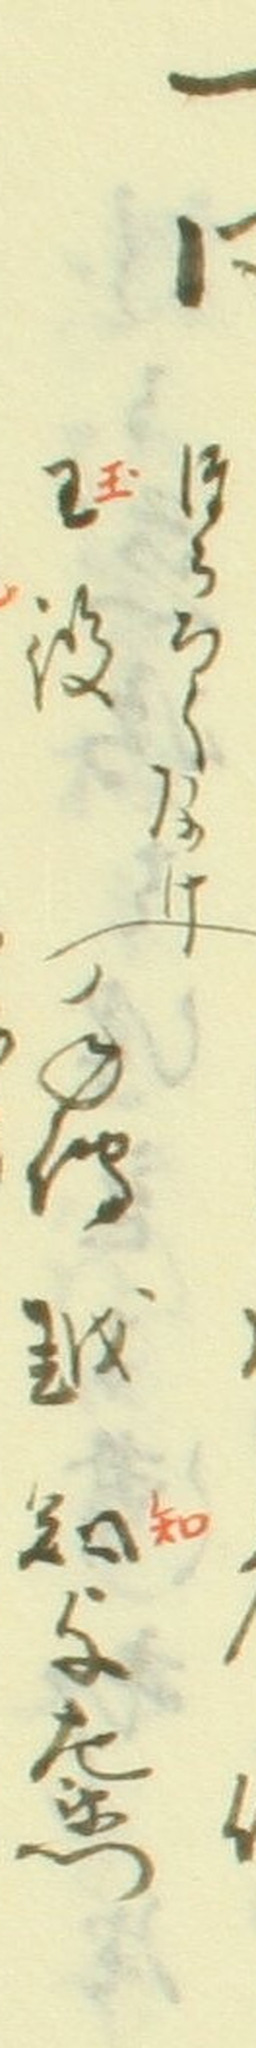玉役手伝越知与左衛門
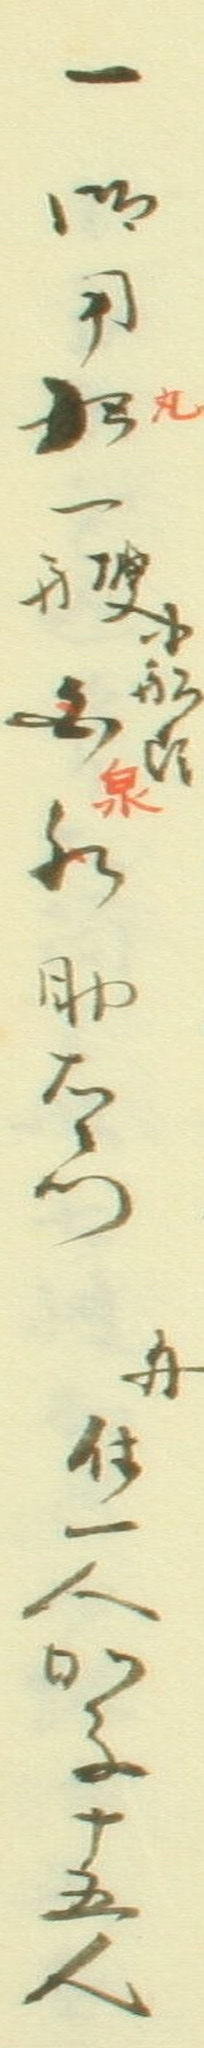一御用船一艘加藤直右衛門舟付壱人か子十五人

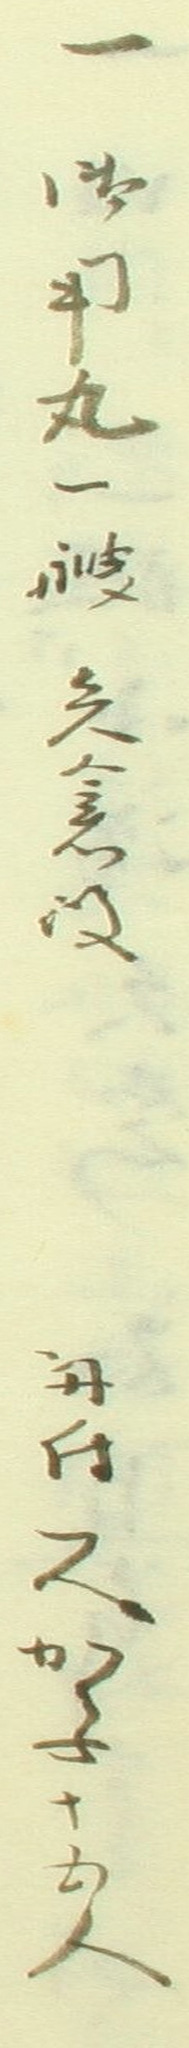一御用丸一艘矢倉役舟付一人か子十五人
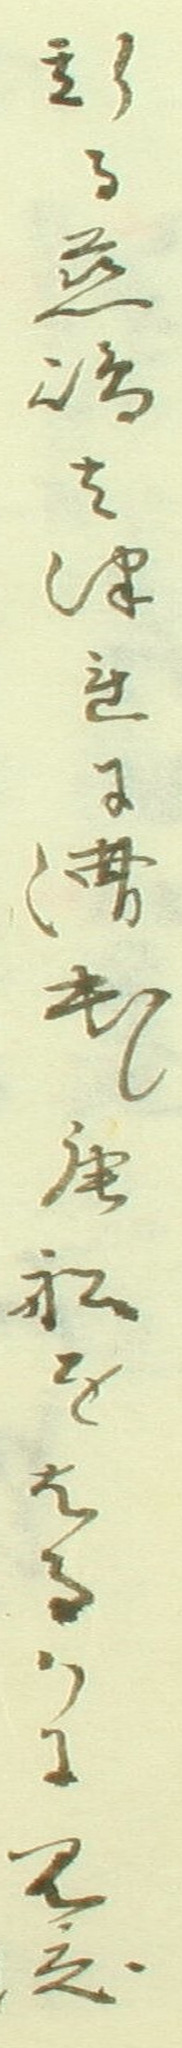斯而慈嶋はあ津れに漕出し唐船をはるかに見渡
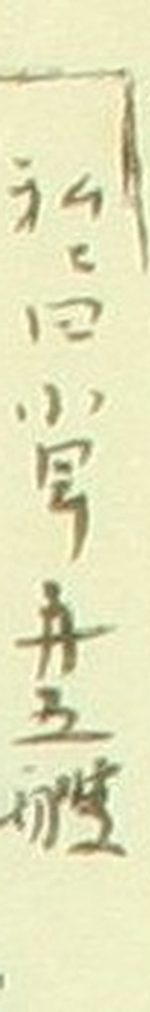私に曰小早舟五艘
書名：唐船漂流記 三
